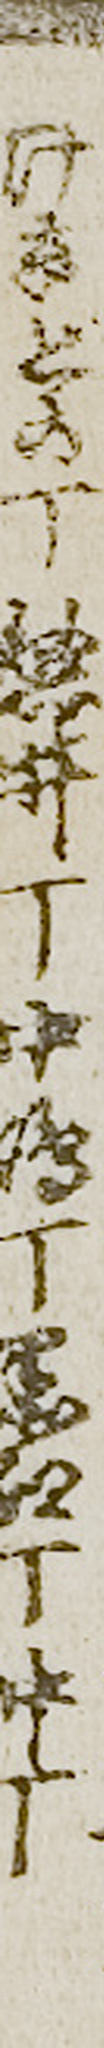けどの丁熊井丁中嶋丁黒江丁仲丁
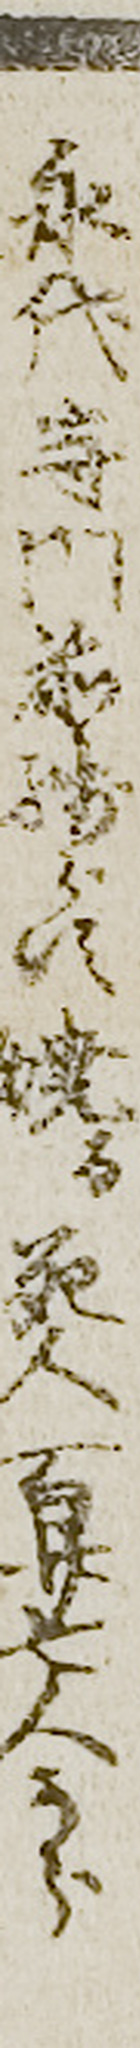永代寺門前残らす焼る死人百廿七人から
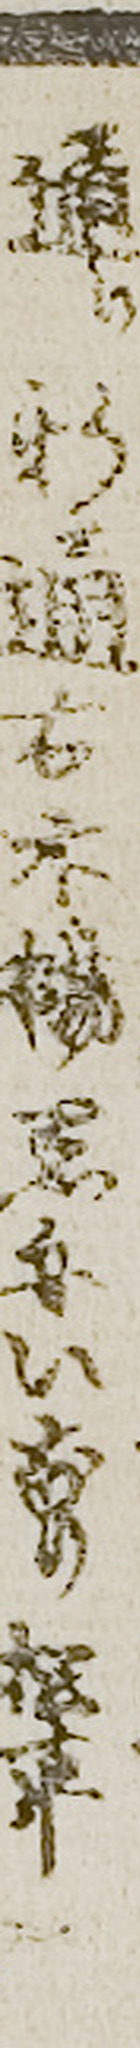通り新通右木バ黒舟いなり松平
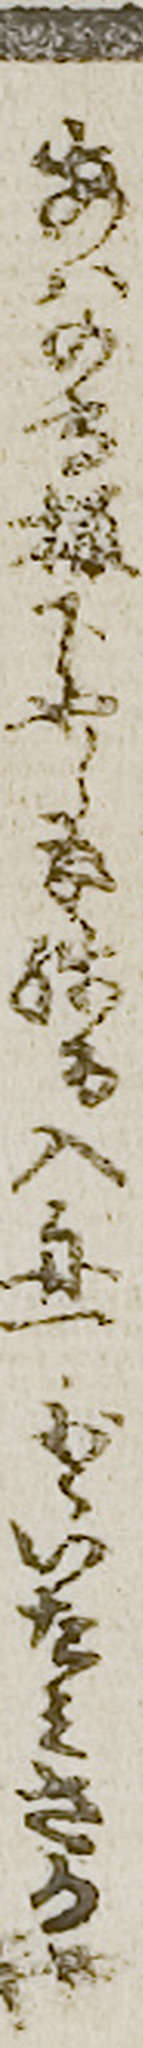あハの守様下やしき残も入舟丁少々いたミさか
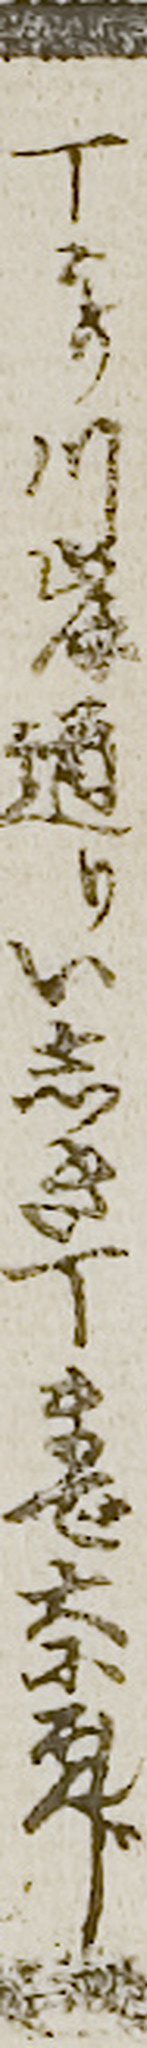丁より川岸通りいしき丁まで大にそんじ
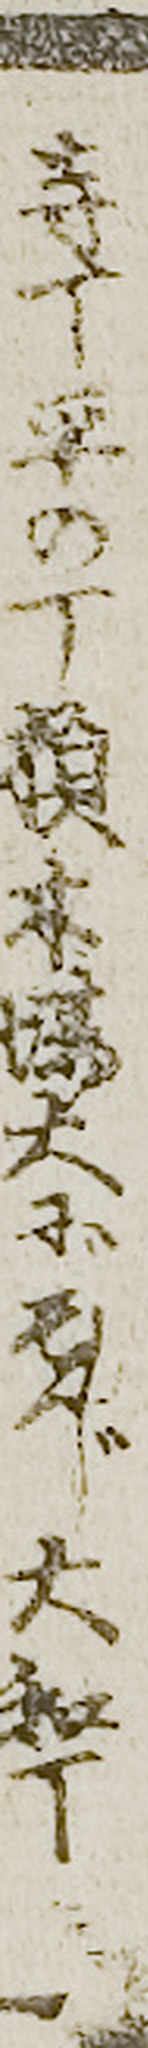寺丁平の丁損木場大にそんじ大和丁
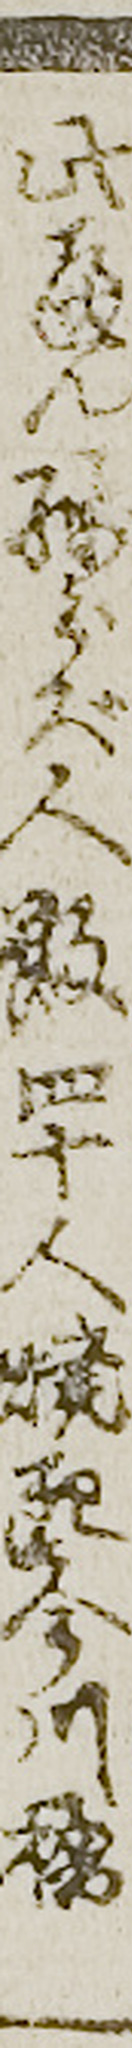此へん残らズ人数四十人焼死今川橋
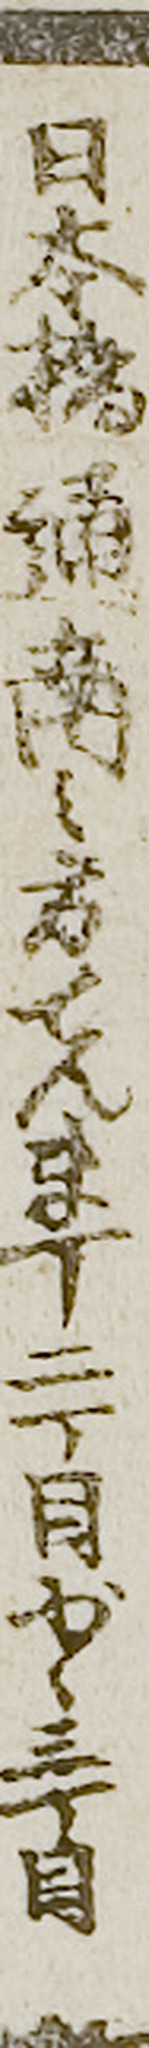日本橋通商之方てんま丁二丁目少々三丁目
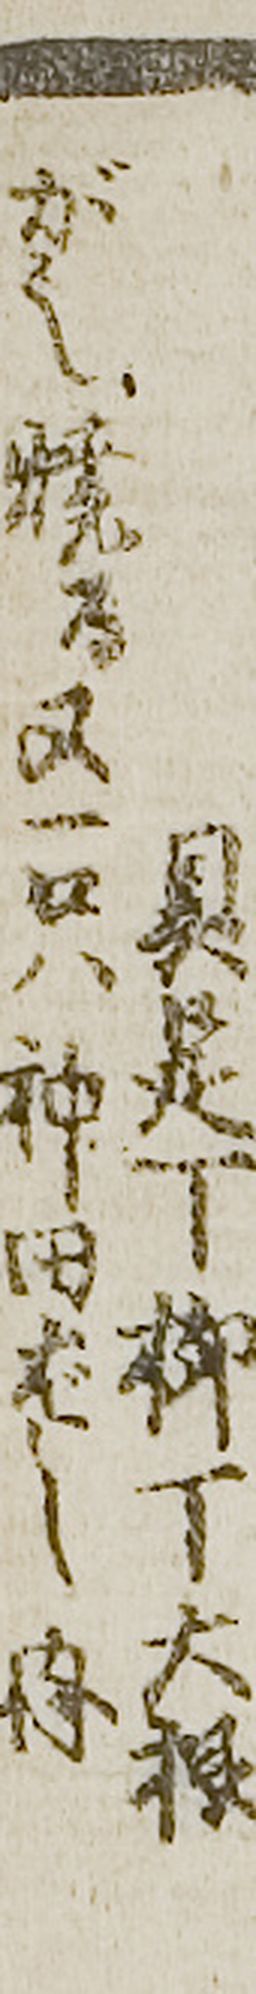がし焼る又一口ハ神田ばし内
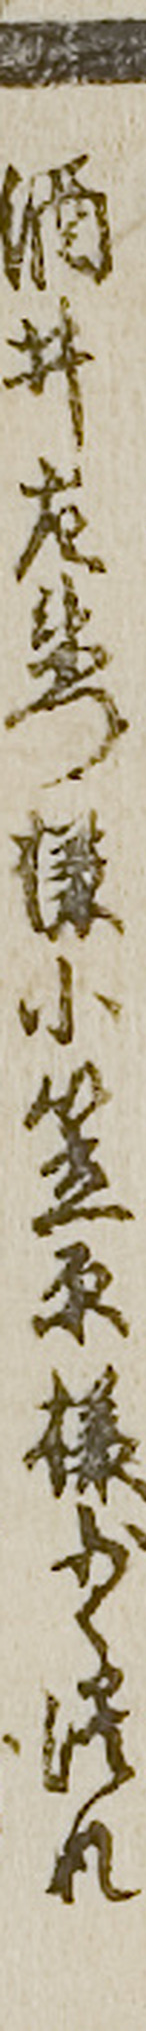酒井左衛門様小笠原様少々潰れ
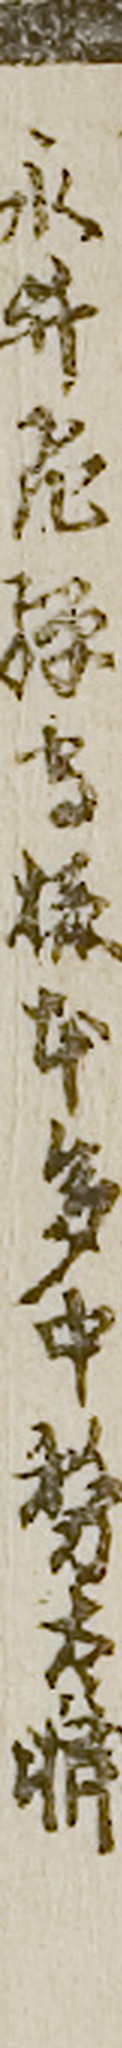永井飛驒守様本多中務太輔
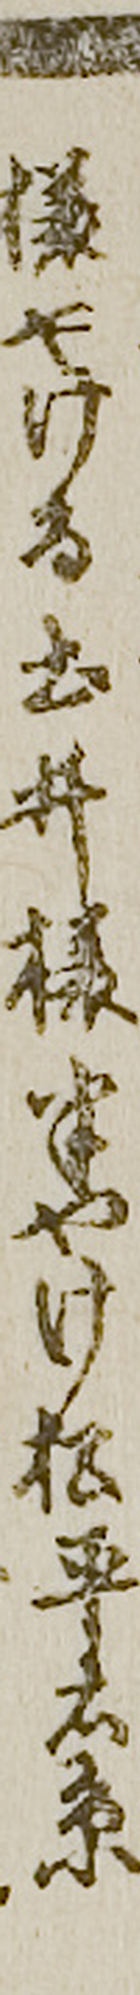様やける土井様半やけ松平右京
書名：江戸大地震出火場所附
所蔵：東京大学総合図書館 General Library in the University of Tokyo, JAPAN
